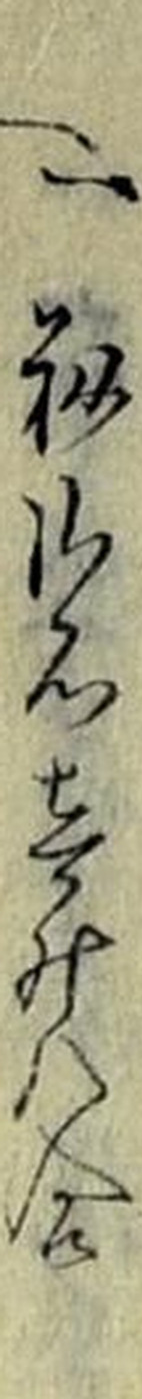一籾弐石壱升八合
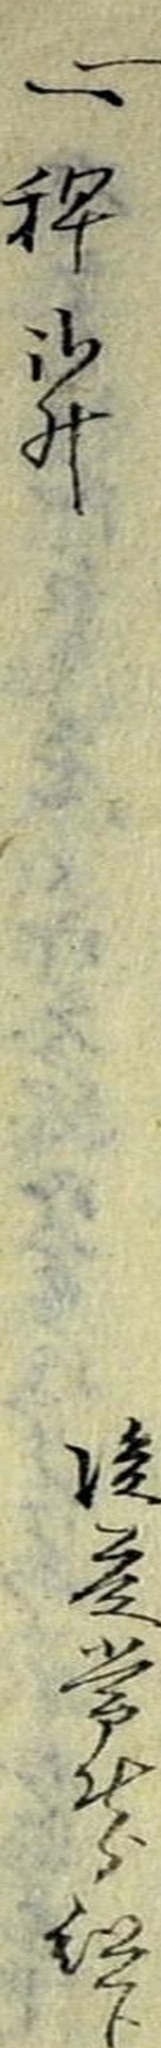一稗弐升後藤常次郎組下
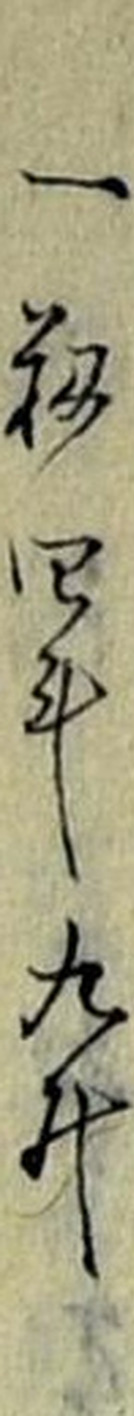一稗四斗六升
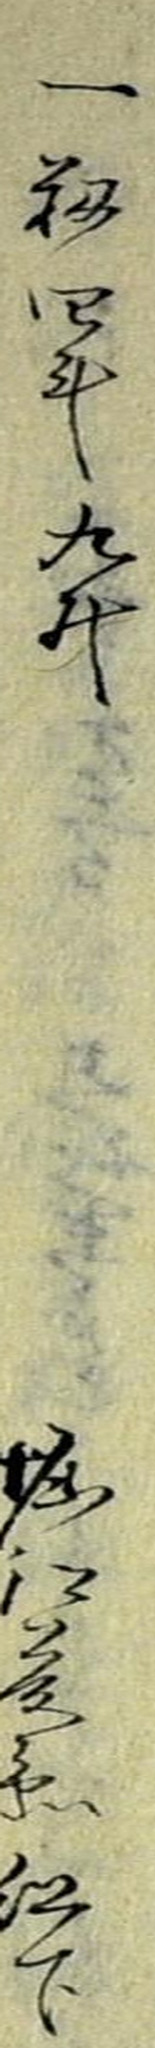一籾四斗九升堀江藤兵衛組下
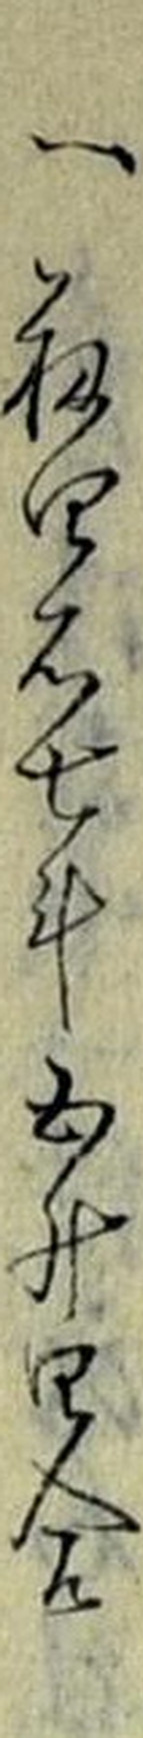一籾四石弐斗五升八合
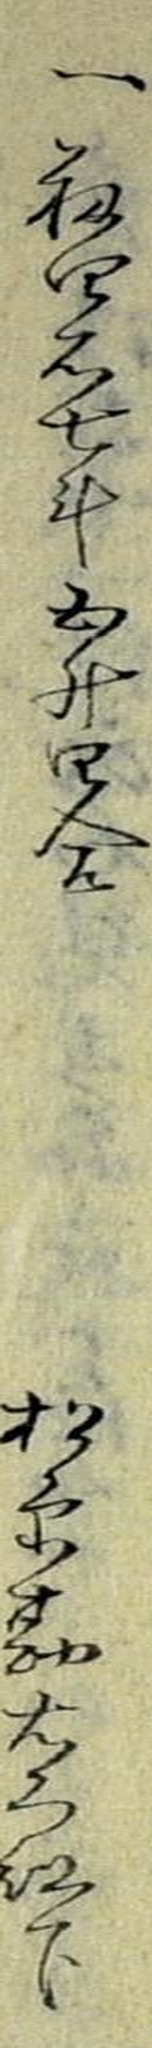一籾四石七斗五升四合松原勘右衛門組下
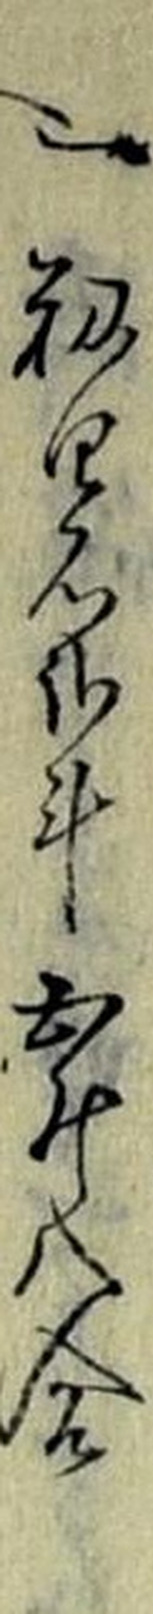一籾四石弐斗五升八合
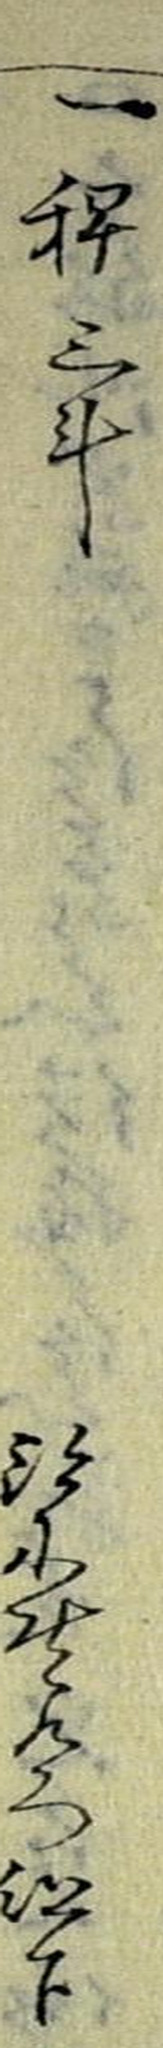一稗三斗鈴木次左衛門組下
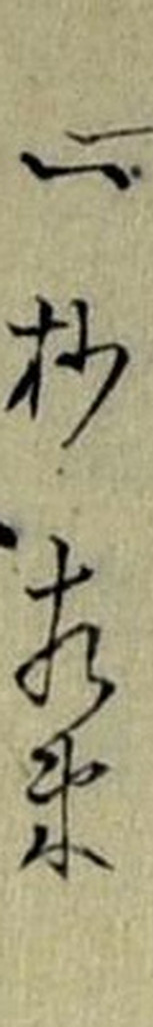一杪拾束
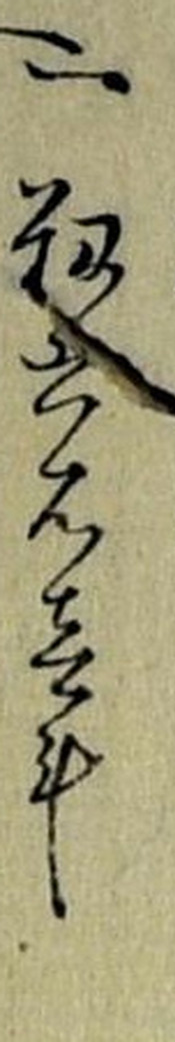一籾六石壱斗
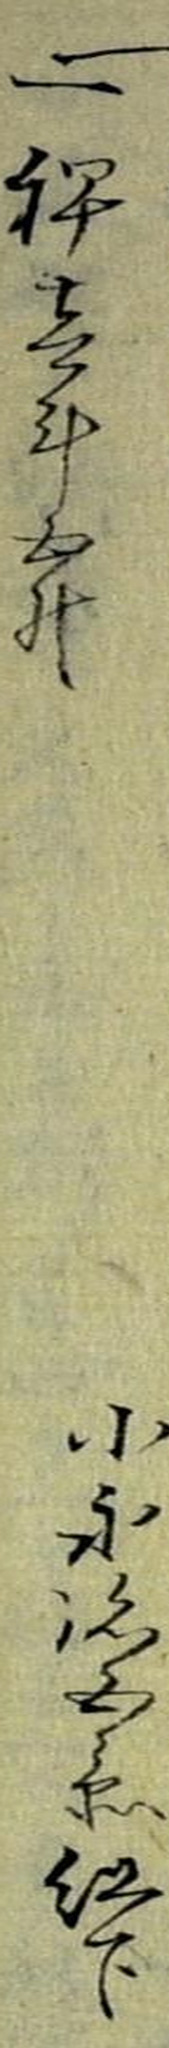一稗壱斗五升小永弥五兵衛組下
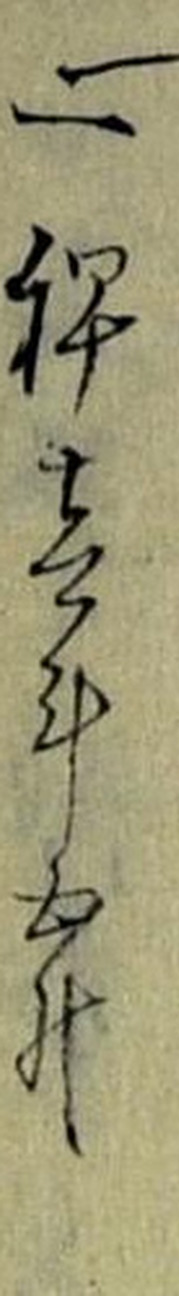一稗四斗六升
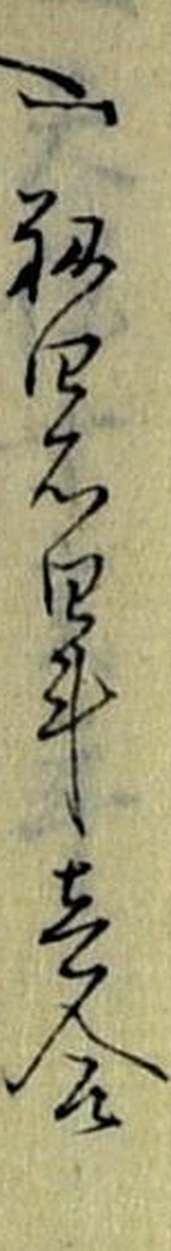一籾四石四斗壱合
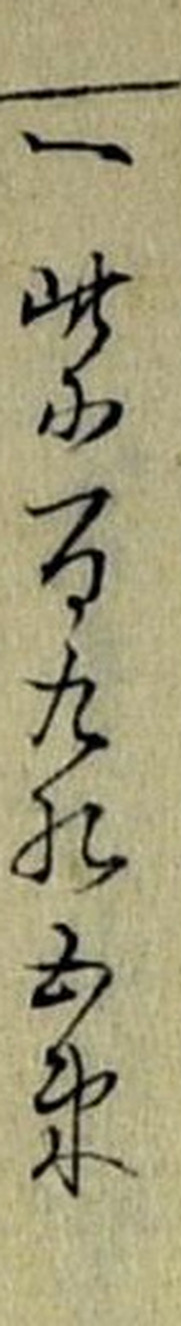一柴百九拾五束
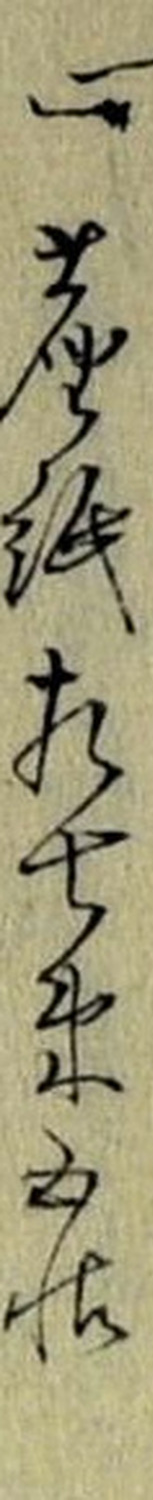一塵紙拾七束五帖
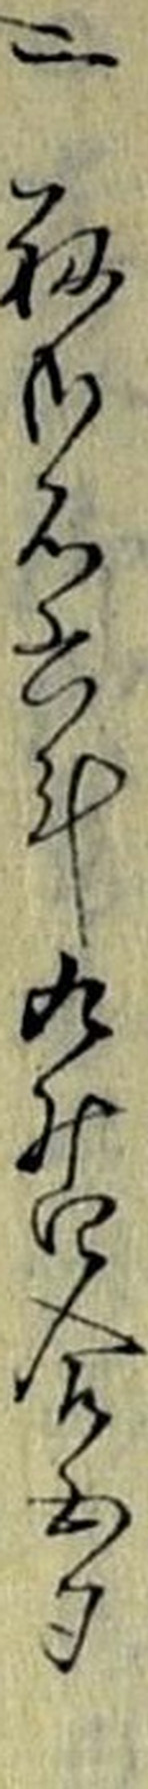一籾弐石六斗九升四合五勺
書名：命令之部 六
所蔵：福井県文書館 Fukui Prefectural Archives
